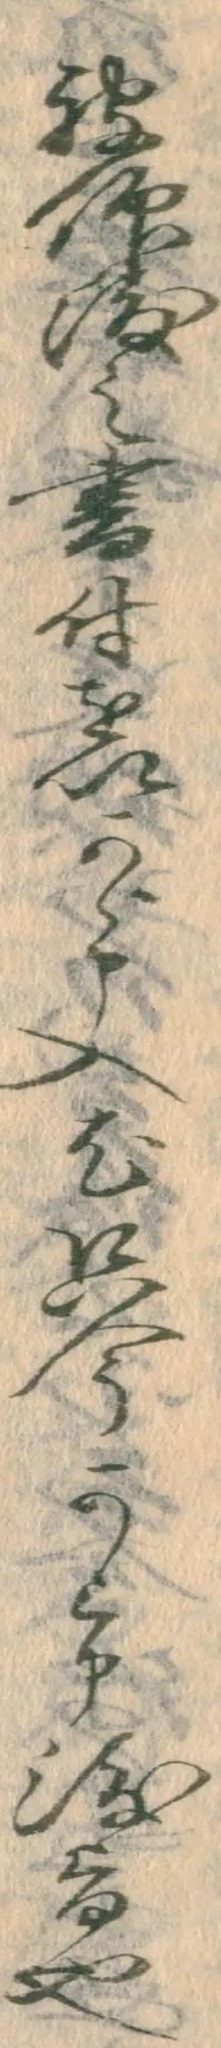被仰渡之書付を以可申入尤只今可被申渡旨也
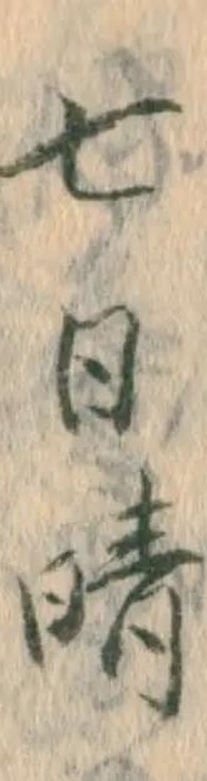七日晴
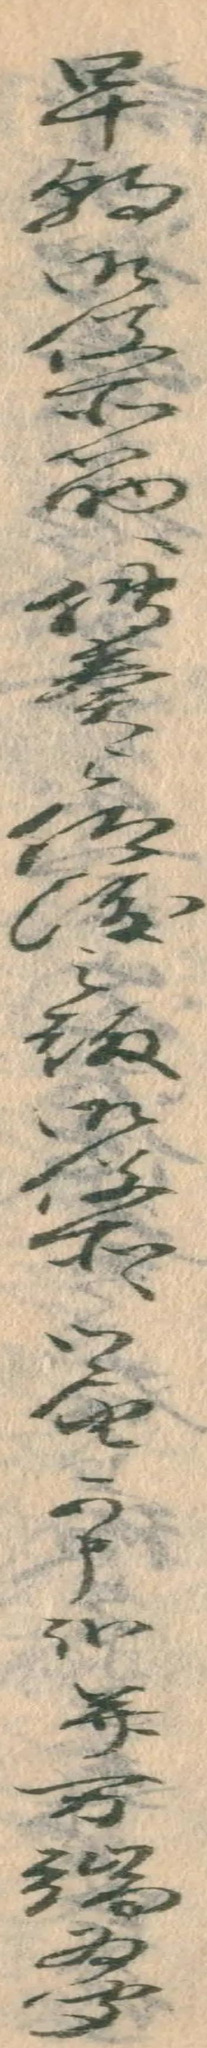一早朝御役所筋へ伝奏被仰渡之趣御役所へ御届可申哉并万端為聞
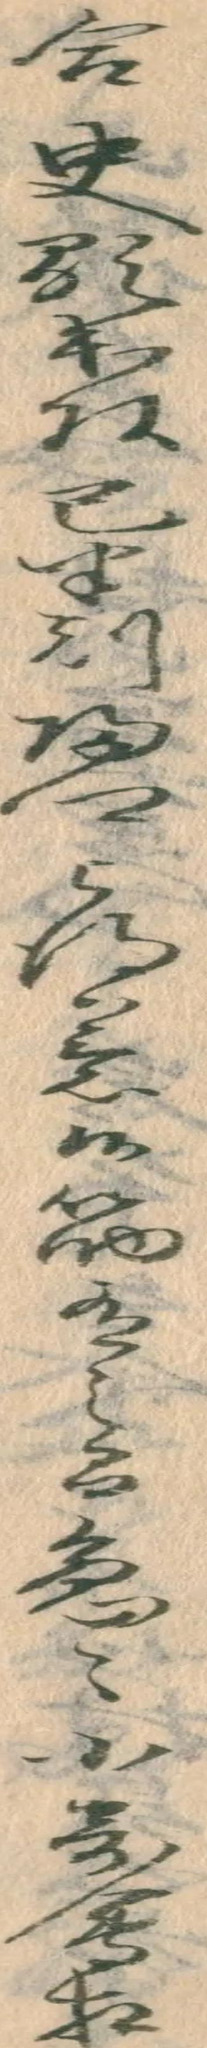合史顕出頭巳半刻帰郷被得御意候筋有之候間急々小寄会相
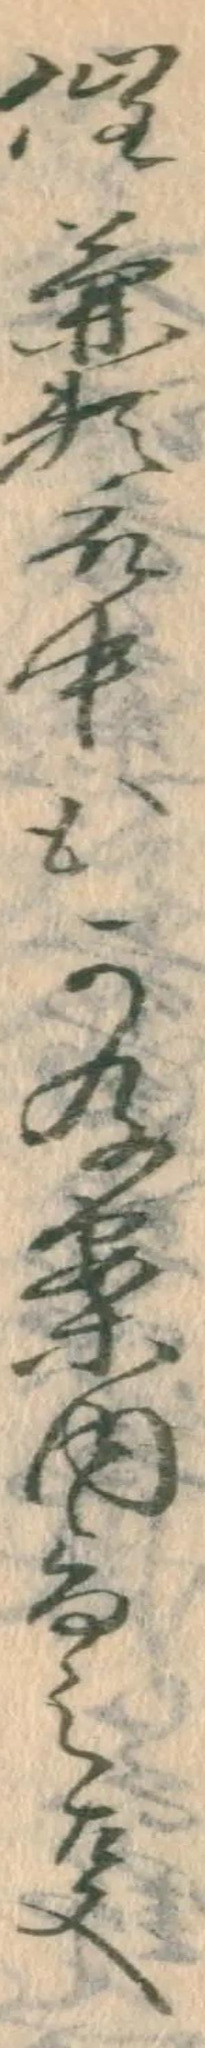催兼頼衆中へも可及案内旨之事
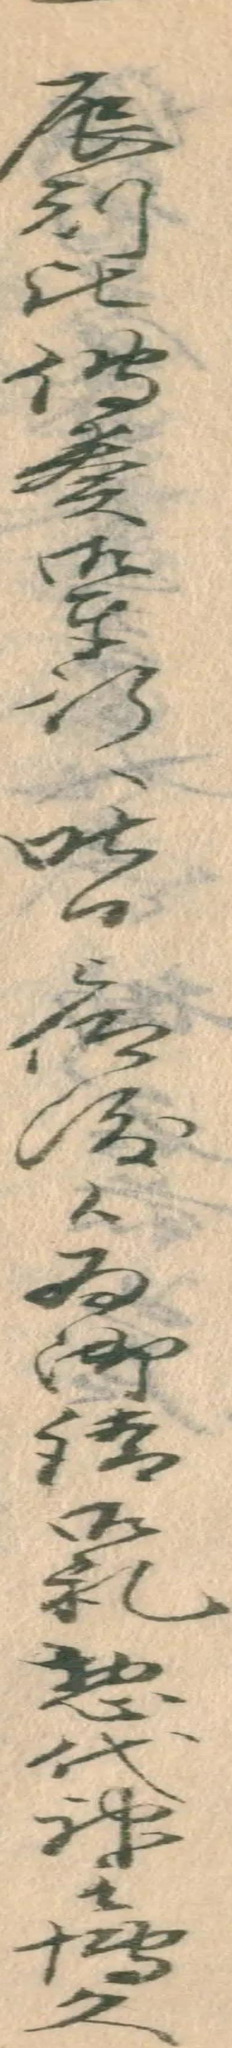一辰刻比伝奏御奉行へ昨日被仰渡候為御請御礼惣代神主博久
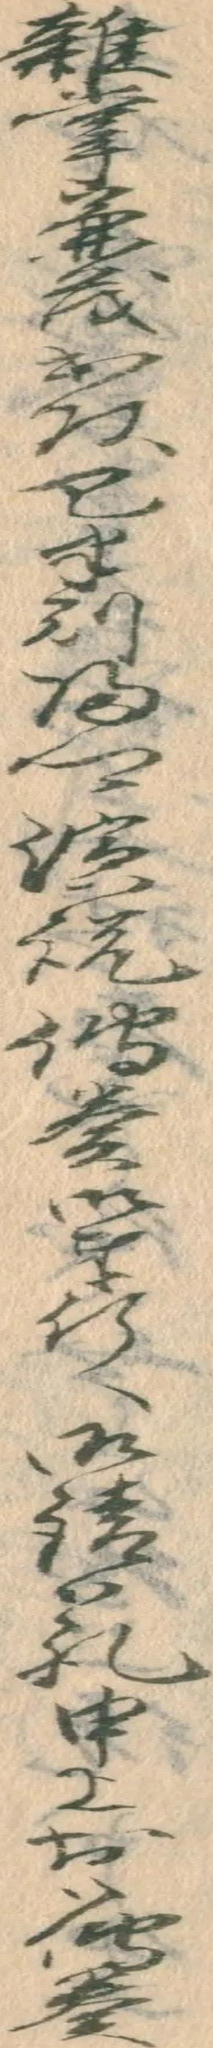雑掌兼茂出頭巳半刻帰郷演説伝奏御奉行へ御請御礼申上於御伝奏
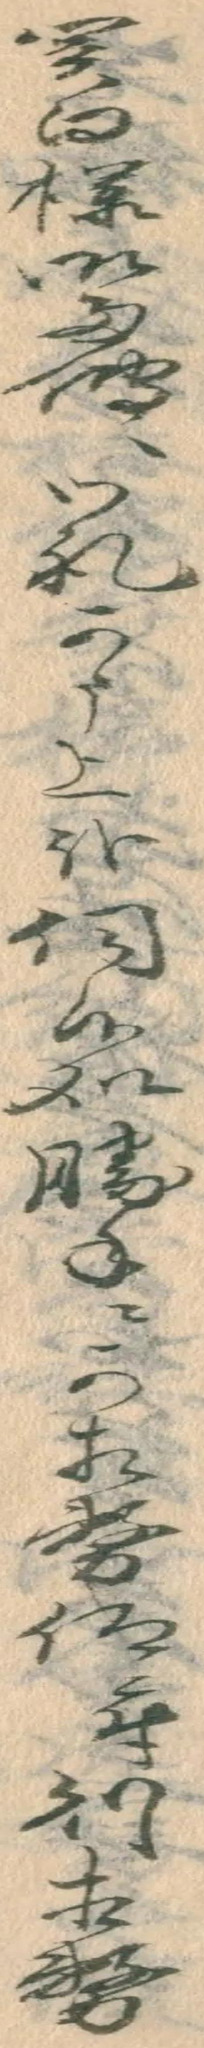関白様御両僧へ御礼可申上哉伺候処勝手ニ可相務仰ニ付則相務
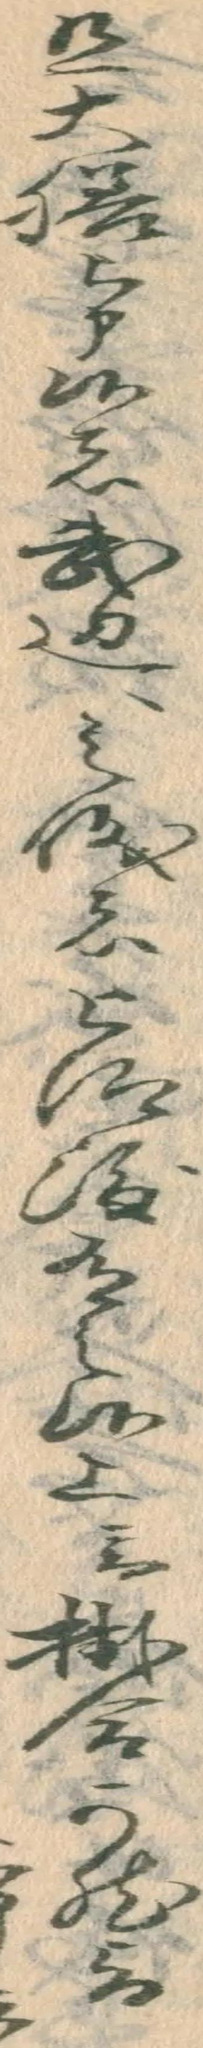且大膳被申候は武辺へ之儀は被仰渡有之候上ニ而掛合可然旨被申云々
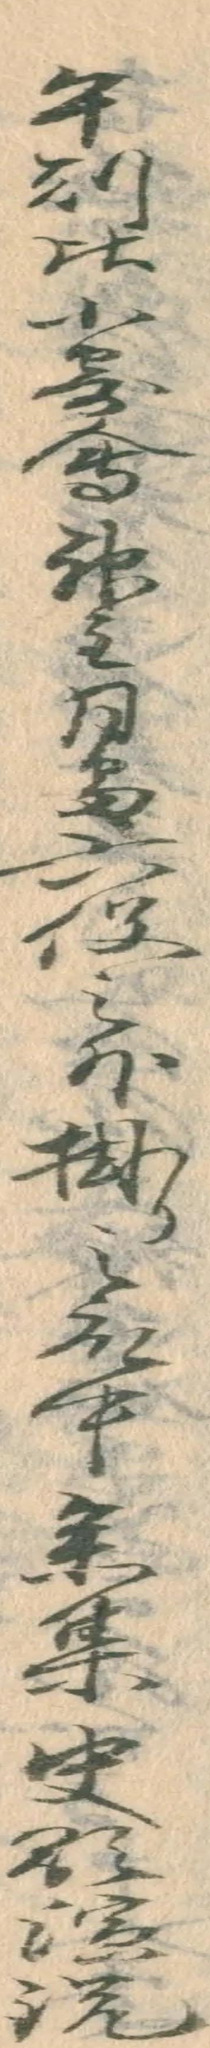一午刻比小寄会神主月番六役之外掛り之衆中参集史顕演説
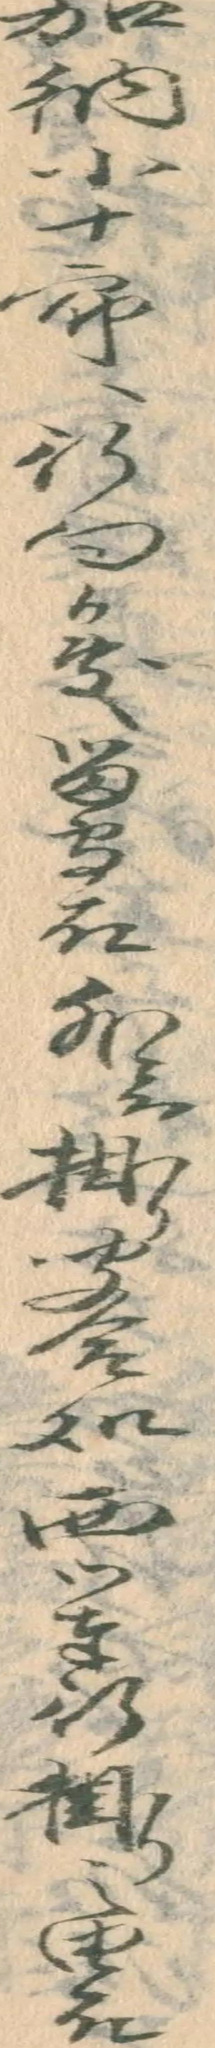加納小十郎へ行向候処留守故外ニ而掛り聞合処西御奉行掛り之由故
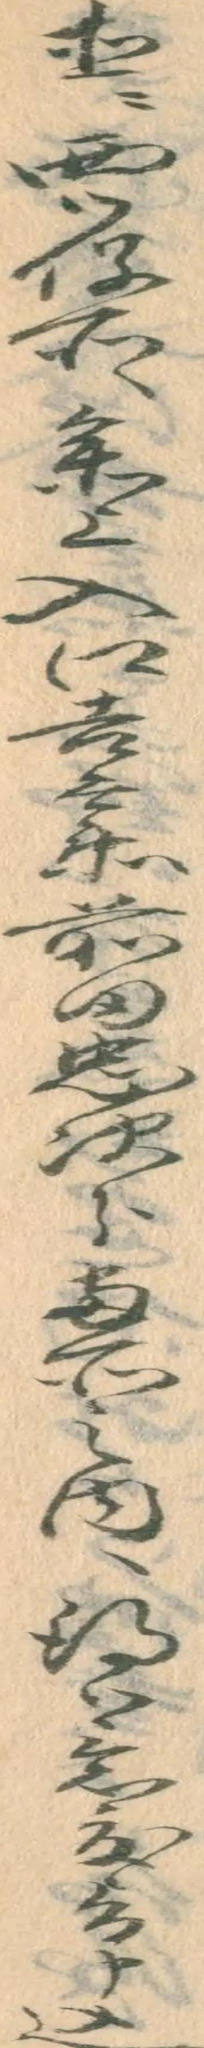直ニ西御役所へ参上入江吉兵衛前田忠次郎両所之内へ得御意度旨申込

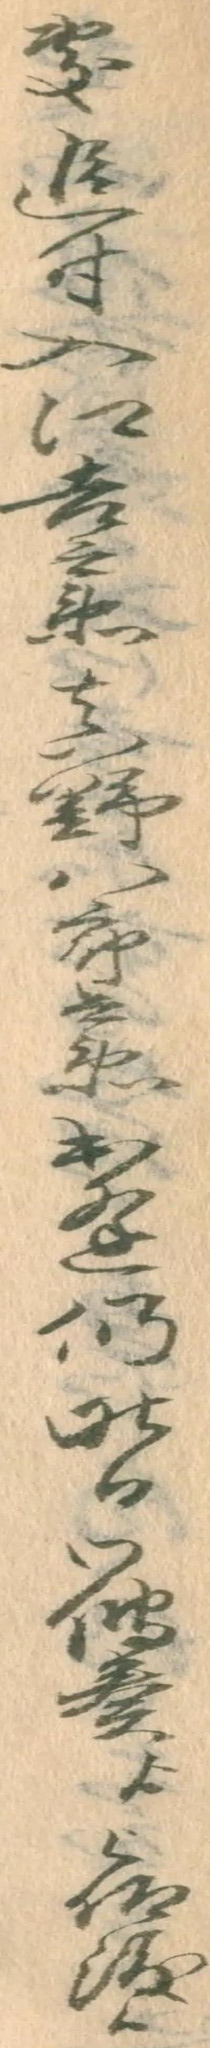処追付入江吉兵衛真野八郎兵衛出逢仍昨日御伝奏ゟ被仰渡候
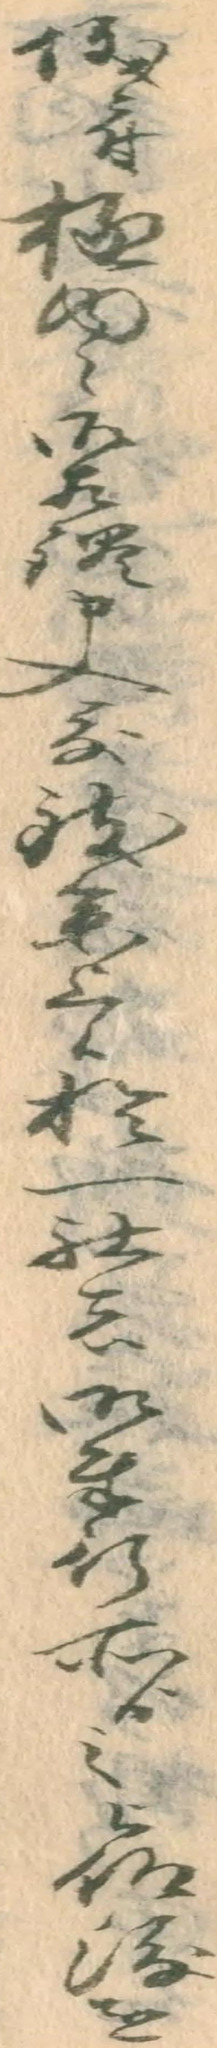儀ニ付極内之御相談申入度致参上候於一社は御奉行所ゟ之被仰渡を
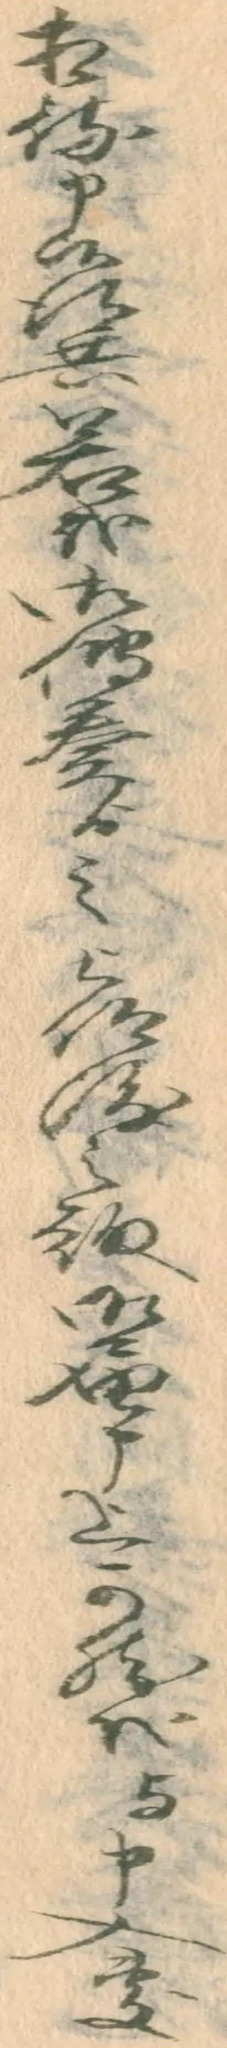相待申候得共若哉御伝奏ゟ之被仰渡之趣御届申上可然哉と申入処
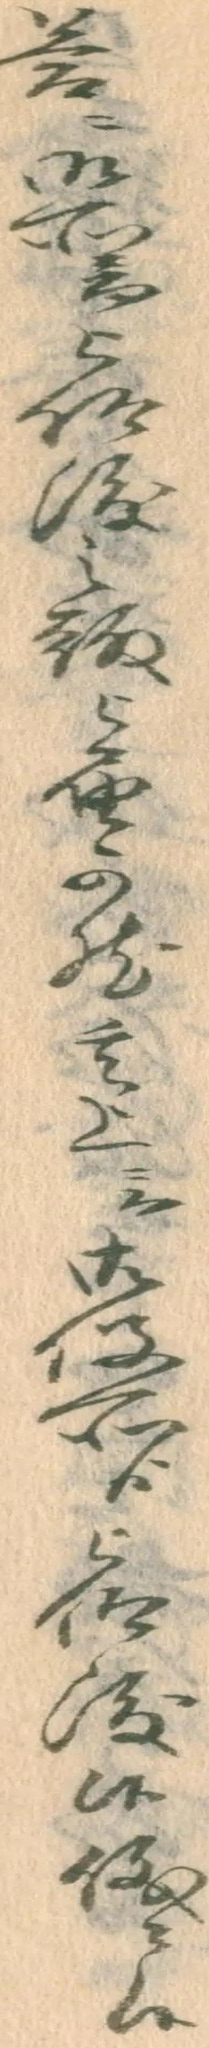答ニ御所ニ而被仰渡之趣被届可然其上ニ而御役所ゟ被仰渡候儀ニ候
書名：賀茂社記録. 第17冊
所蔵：国立国会図書館 National Diet Library, JAPAN
